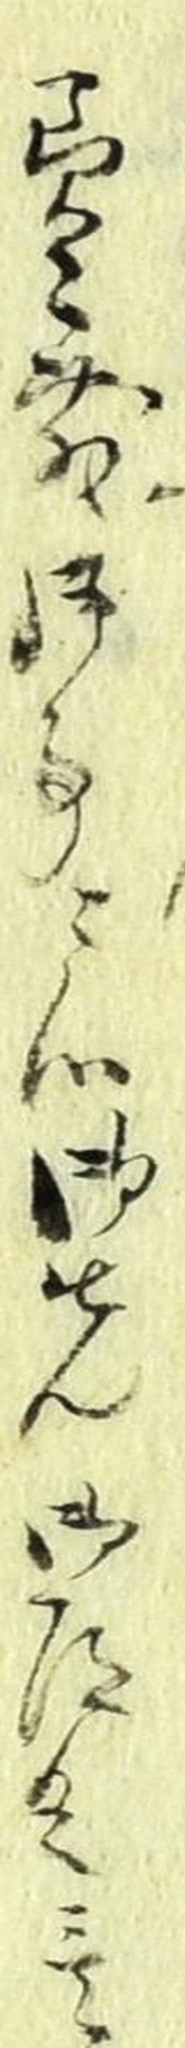美々敷御事に候御先御道具には
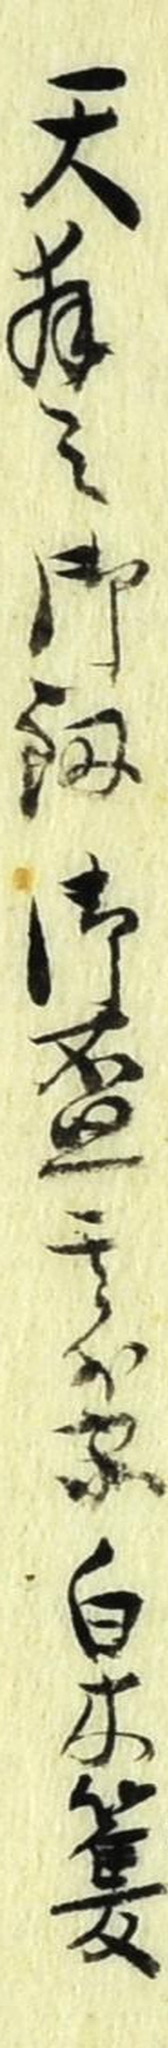天拝之御剣御盃其外品白木篗
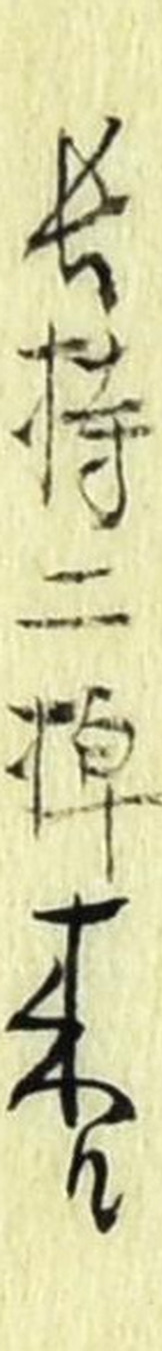長持二棹来る
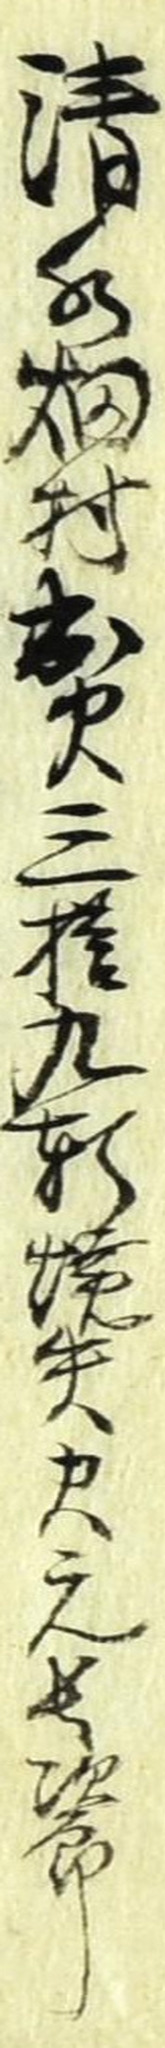清水畑村出火三拾九軒焼失火元長次郎
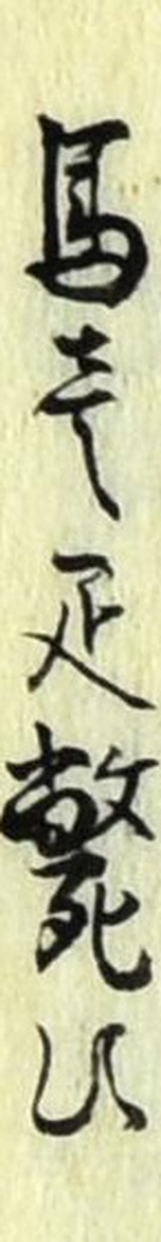馬壱疋斃す

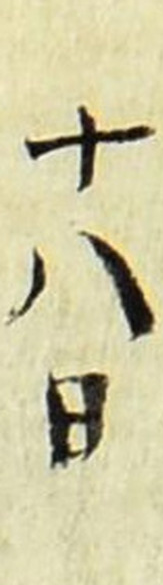十八日
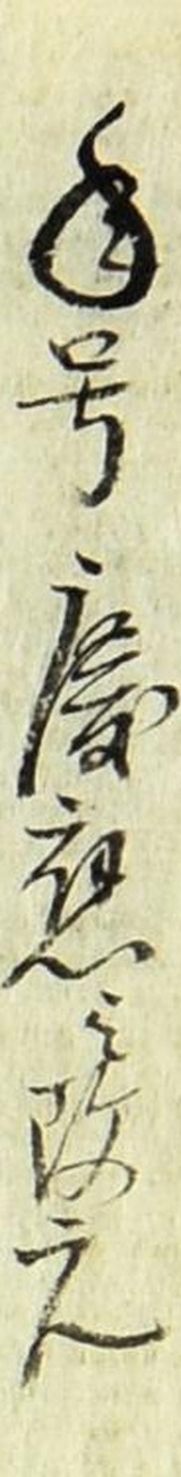年号慶応と改元
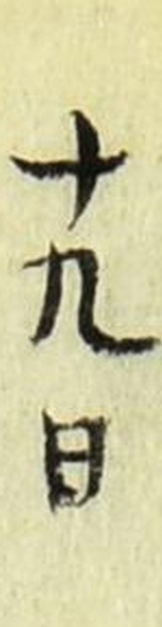十九日
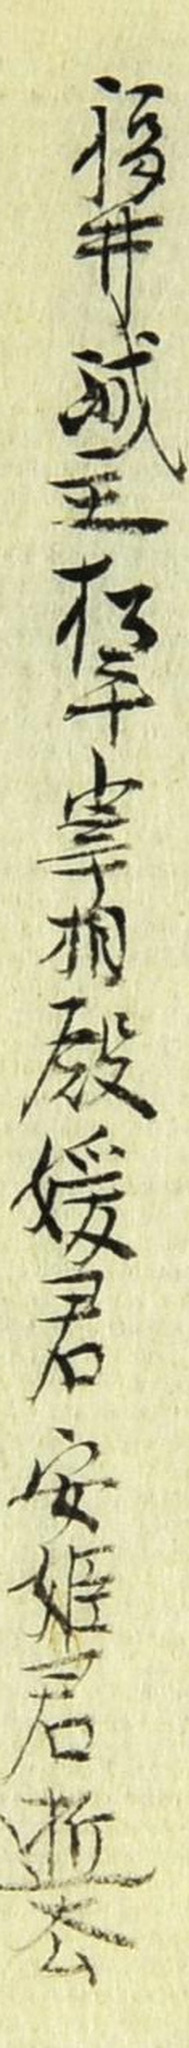福井城主松平宰相殿媛君安姫君逝去

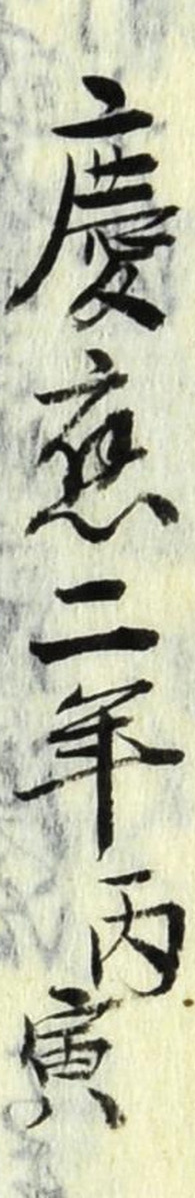慶応二年丙寅
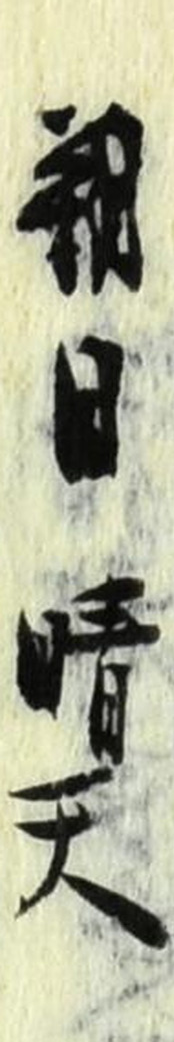朔日晴天
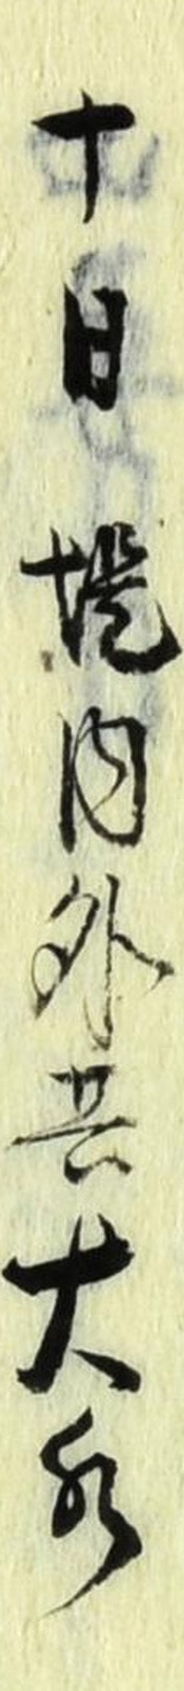十日堤内外共大水

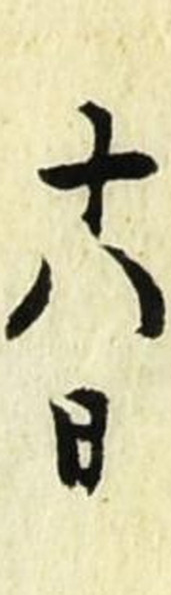十八日
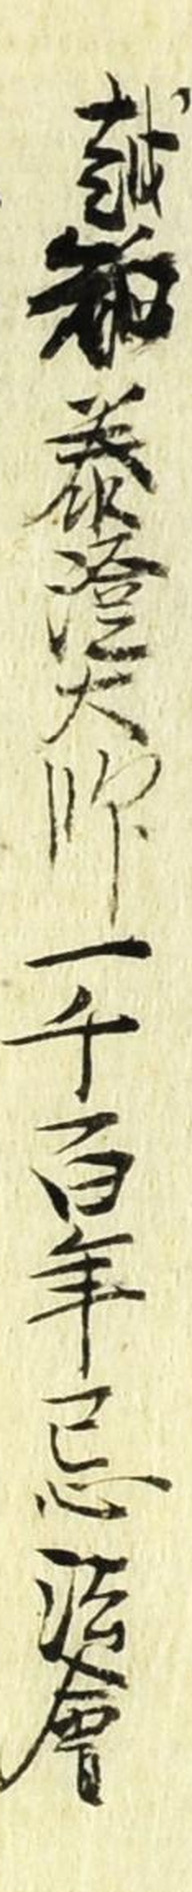越知泰澄大師一千百年忌法会
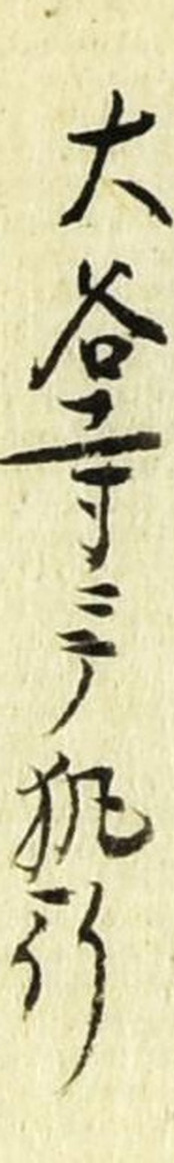大谷寺にて執行
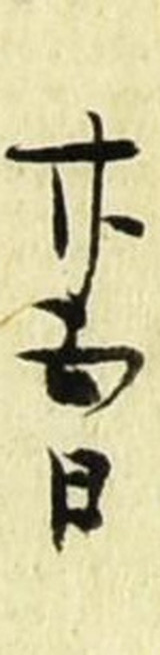廿五日
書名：（日記）
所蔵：福井県文書館 Fukui Prefectural Archives
